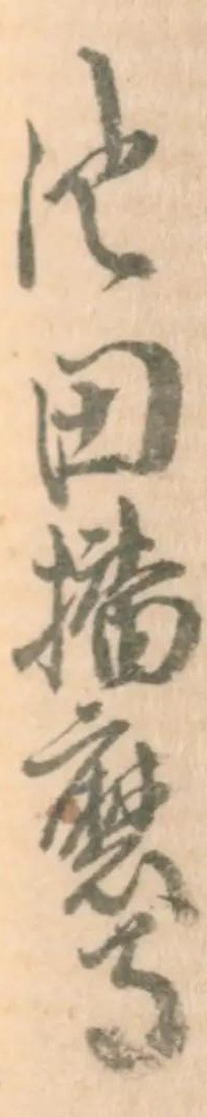池田播磨守
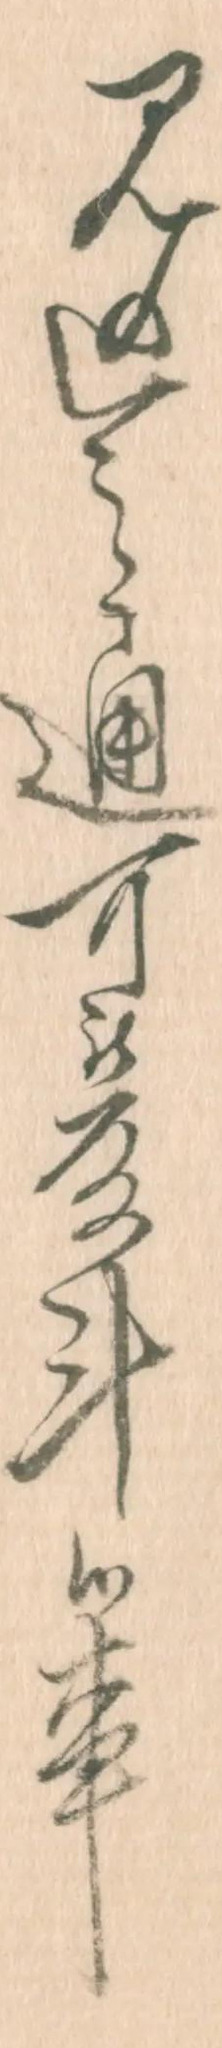見込之通可被取計候事

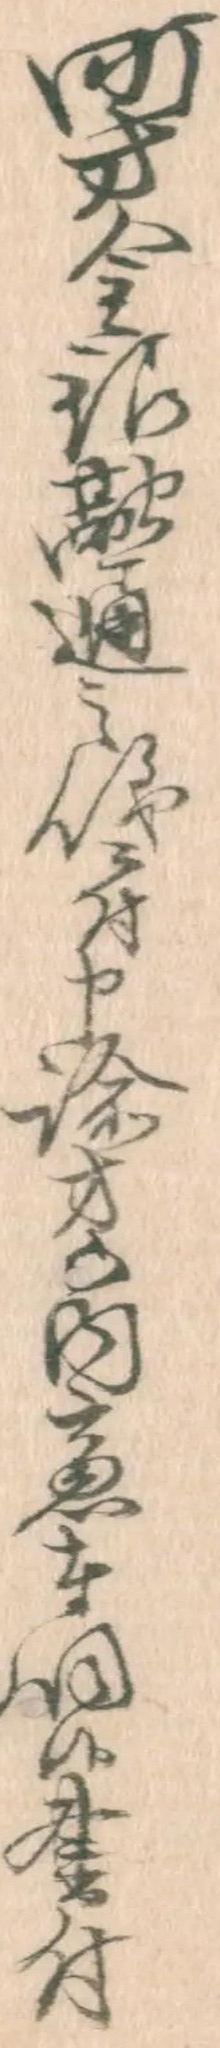│町方金銀融通之儀ニ付申諭方御内慮奉伺候書付
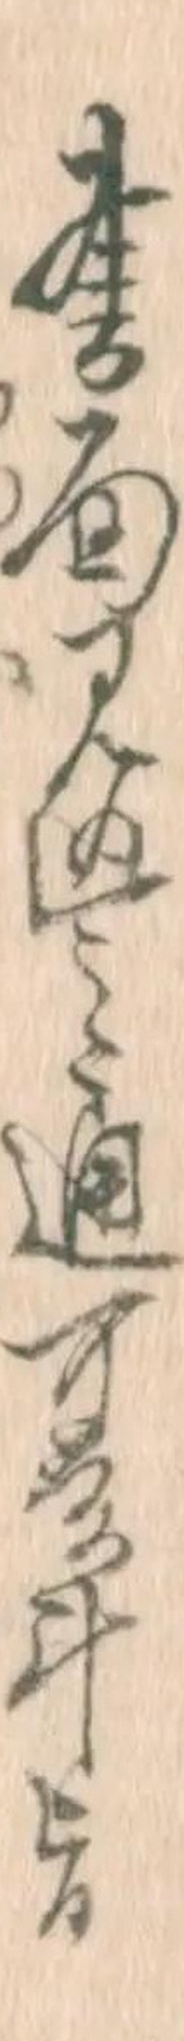│書面見込之通可取計旨

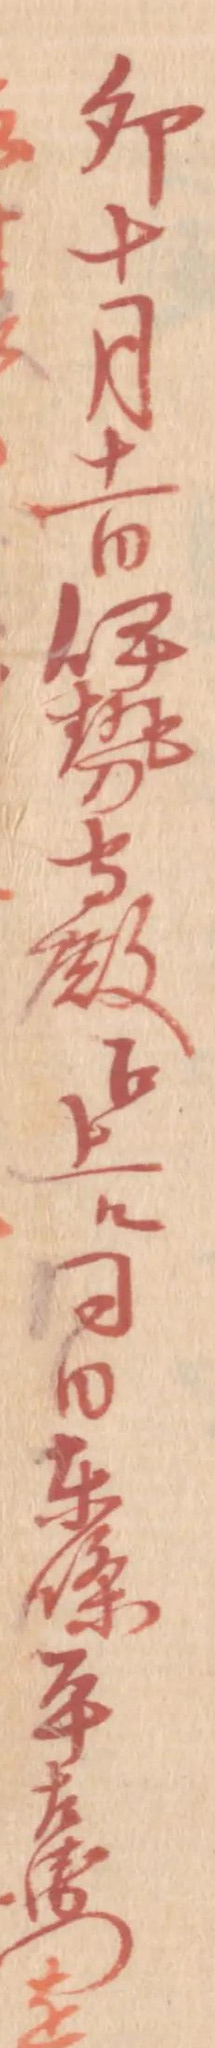「卯十月十一日伊勢守殿え上ル同日東条平左衛門を以御渡
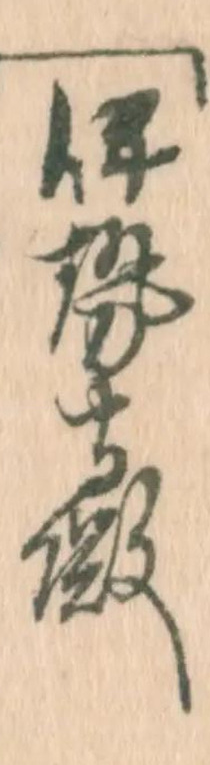│[伊勢守殿
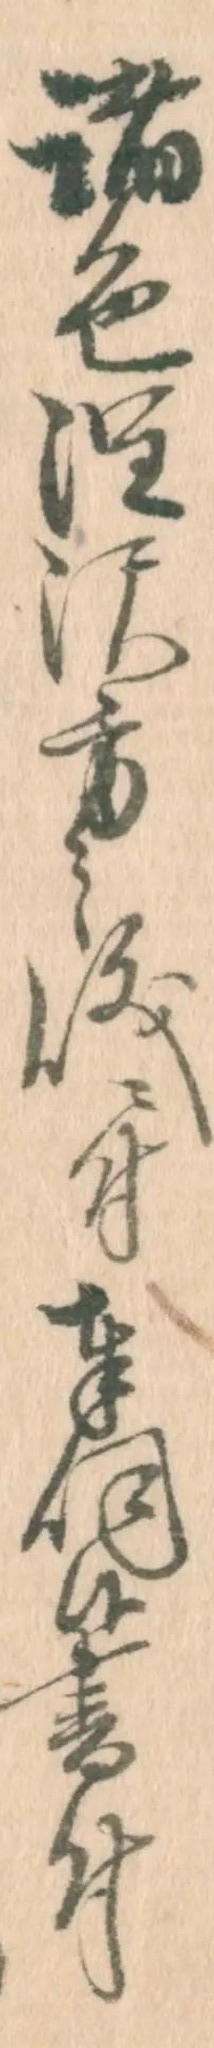│諸色潤沢方之儀ニ付奉伺候書付
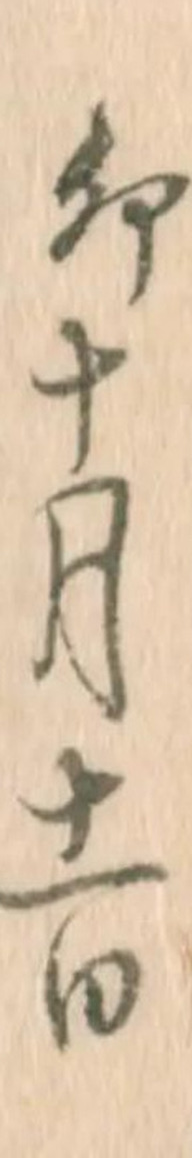│卯十月十一日

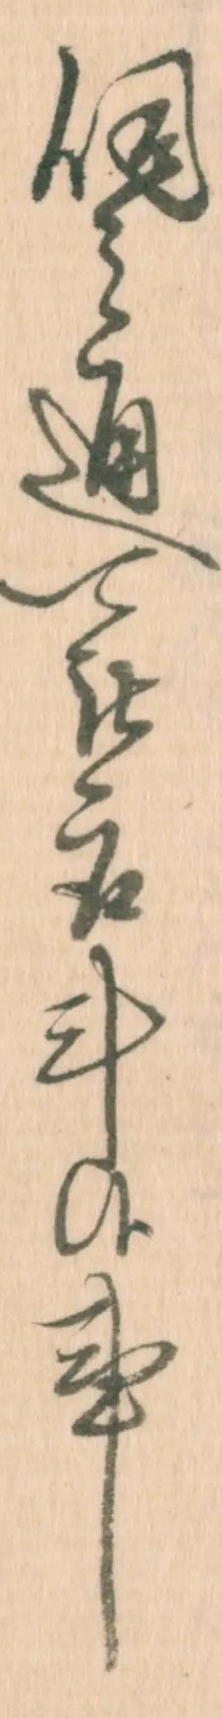伺之通可被取計候事
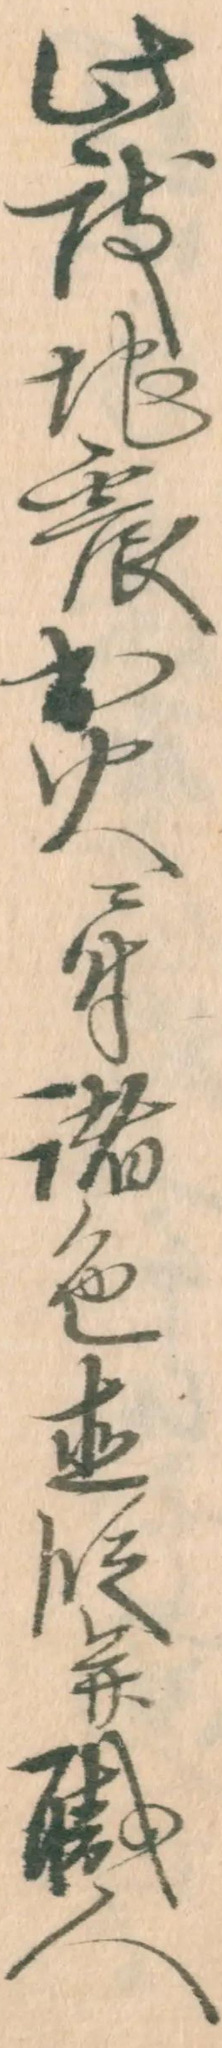此度地震出火ニ付諸色直段幷職人
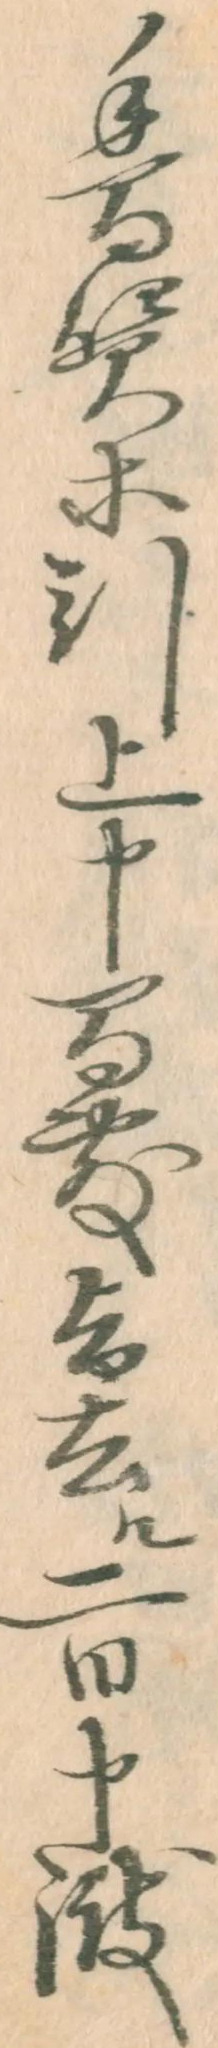手間賃等引上申間敷旨去ル二日申渡

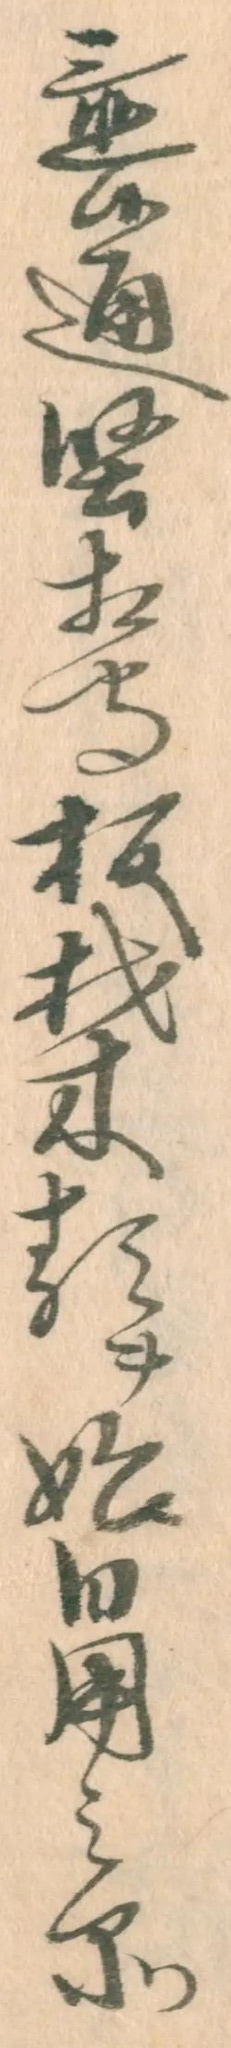置候通堅相守板材木類ヲ始日用之品
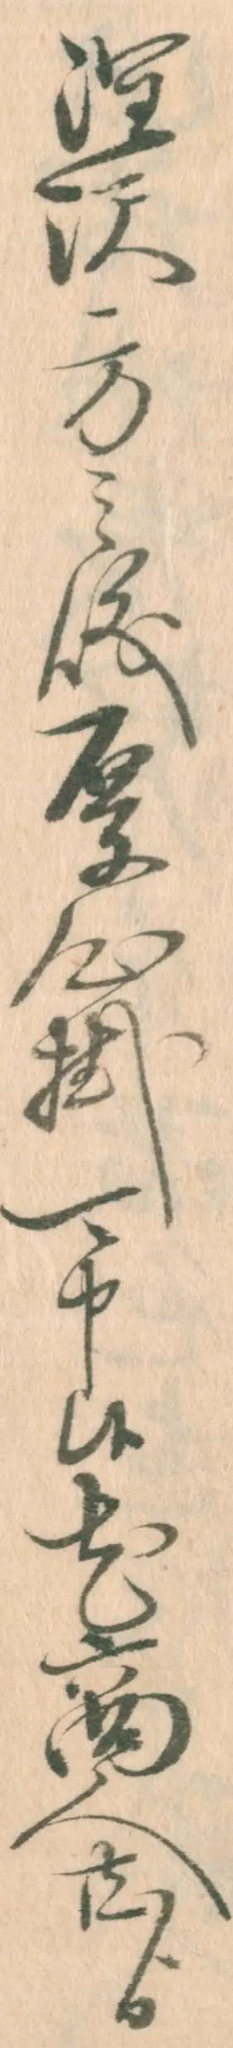潤沢方之儀厚心掛可申候尤商人共ゟ
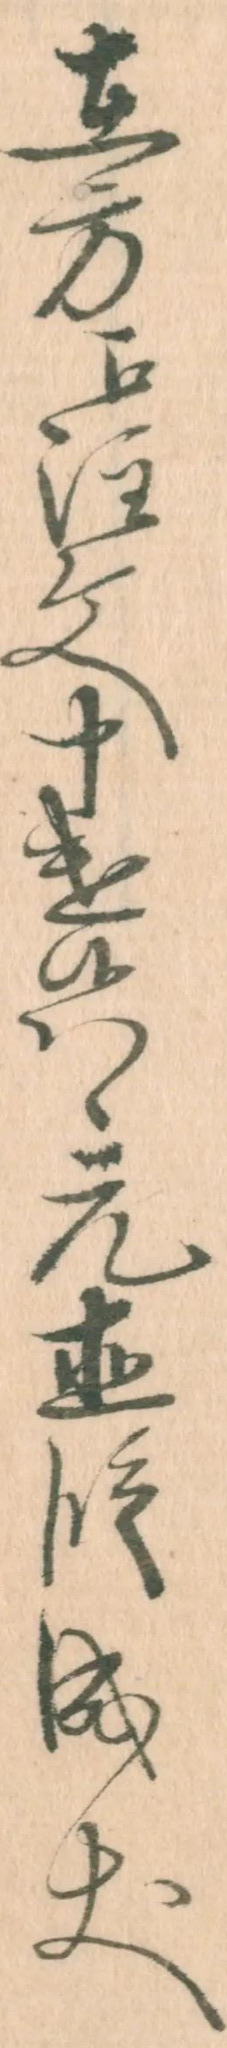在方え注文申遣候ハヽ元直段成丈
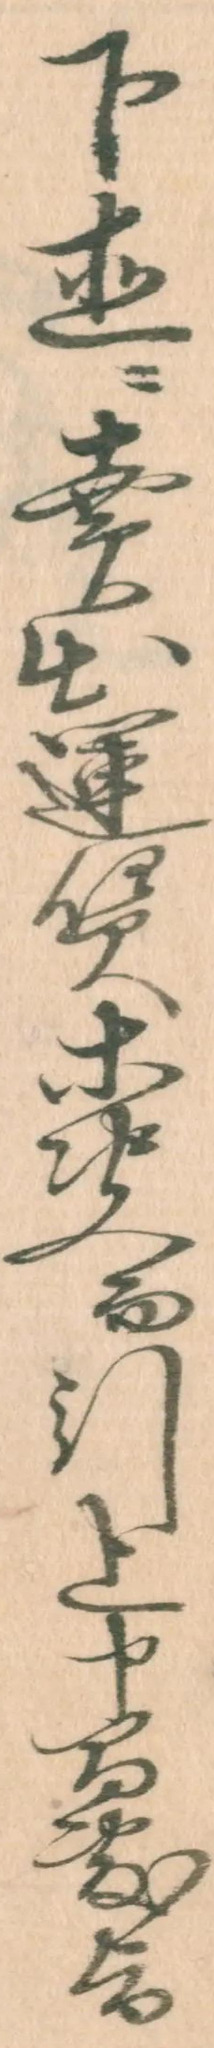下直ニ売出運賃等決て引上申間敷旨
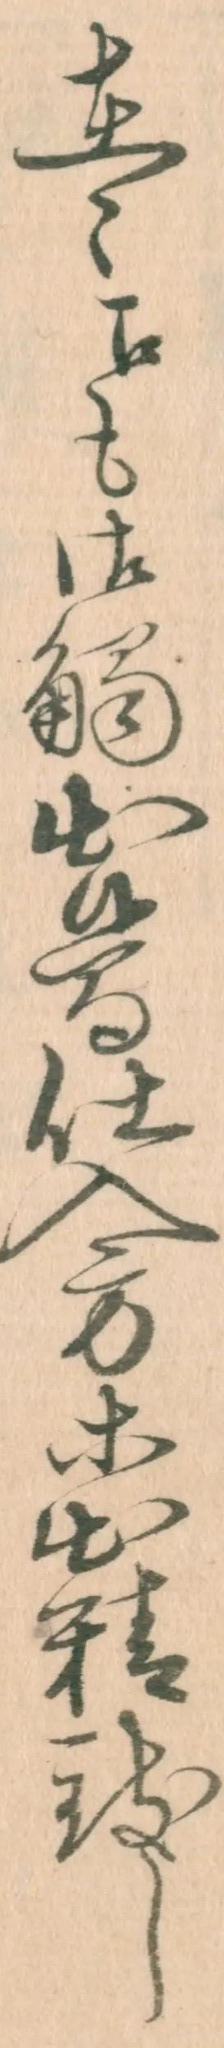在〻えも御触出候間仕入方等出精致し
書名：地震災書留 2巻. [2] 内表紙に「地震一件　安政二卯年十月」とあり
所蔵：国立国会図書館 National Diet Library, JAPAN
